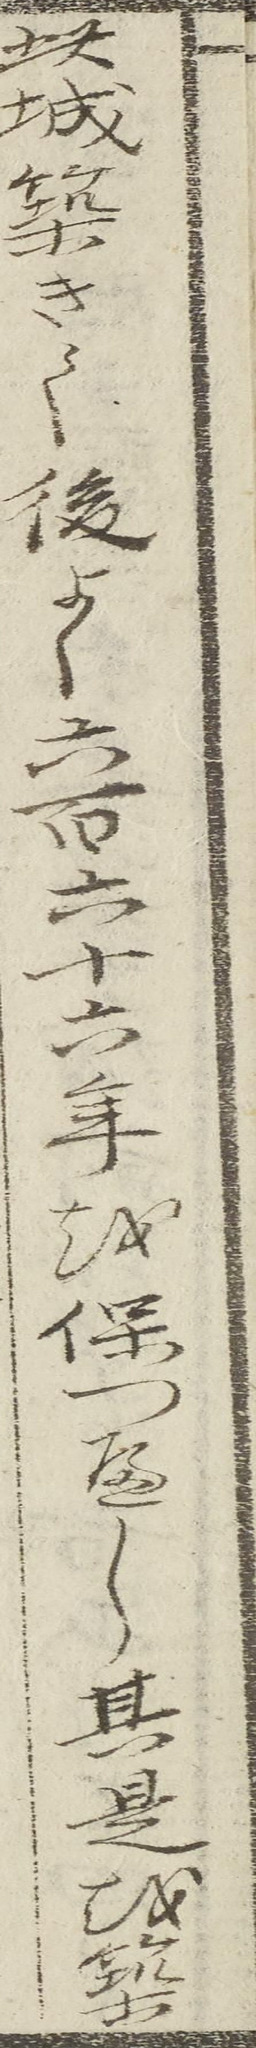此城を築きて後よく六百六十六年を保つへし其是を築
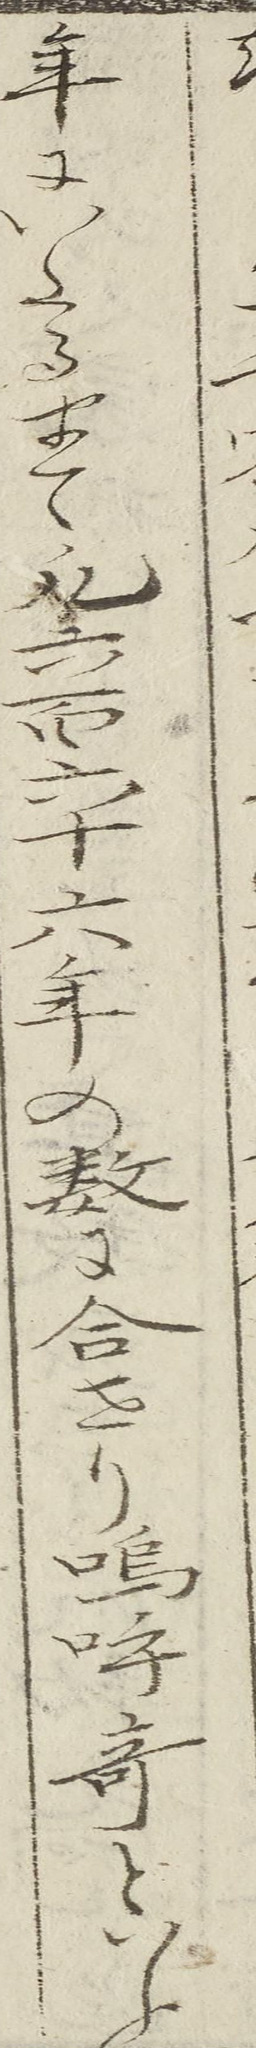年にいたるまて凡六百六十六年の数に合せり嗚呼奇といふ
